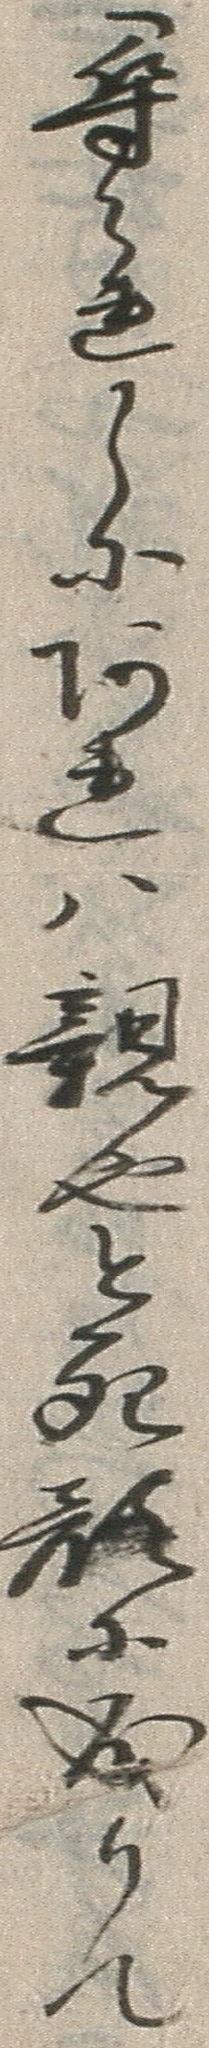尋られしにあれは親也と死顔に成りて
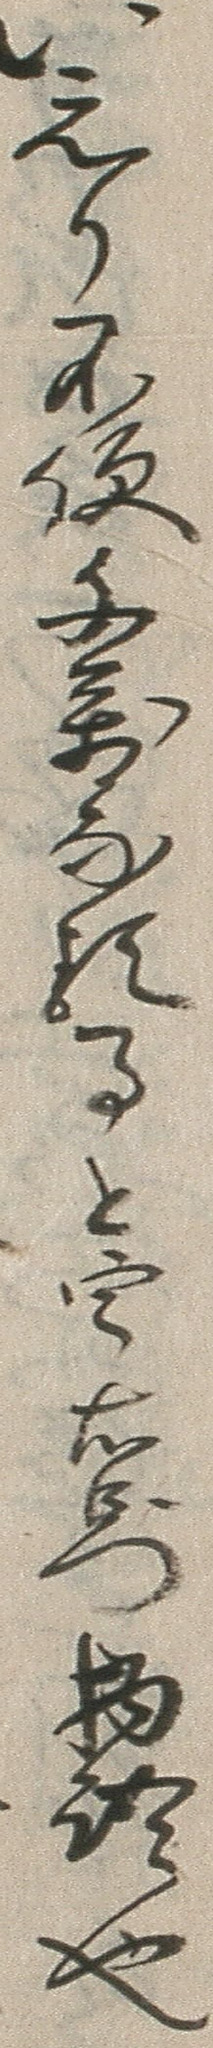いえり不便千万なる事と宇右衛門物語也
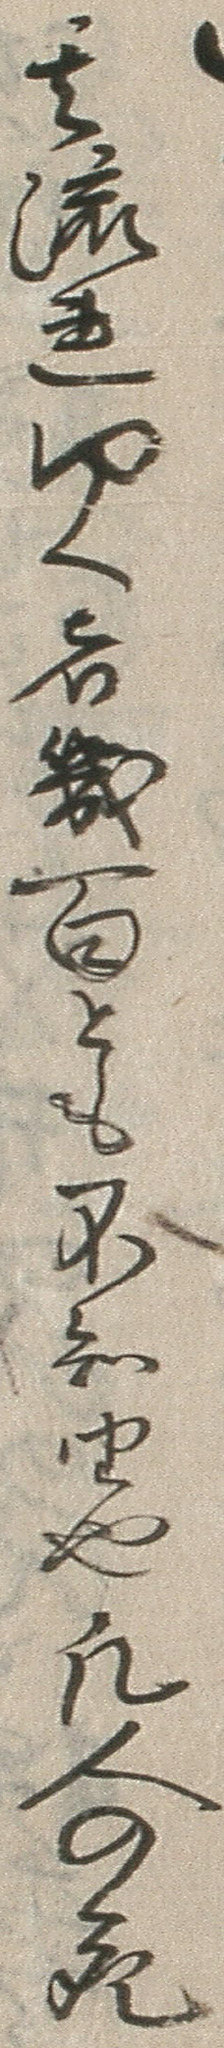其流れゆく者幾百とも不知由也凡人の死
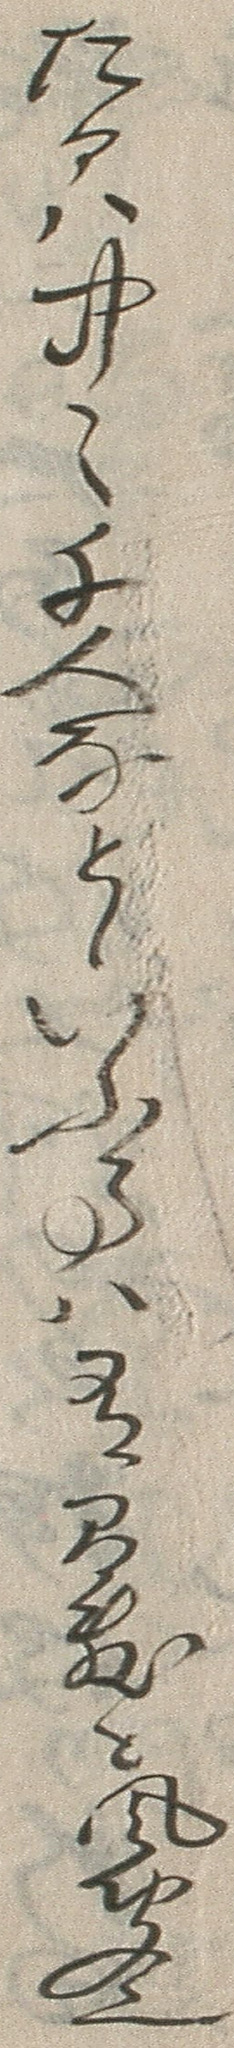たるは中々千人なとゝいふ事は有間敷と風聞也
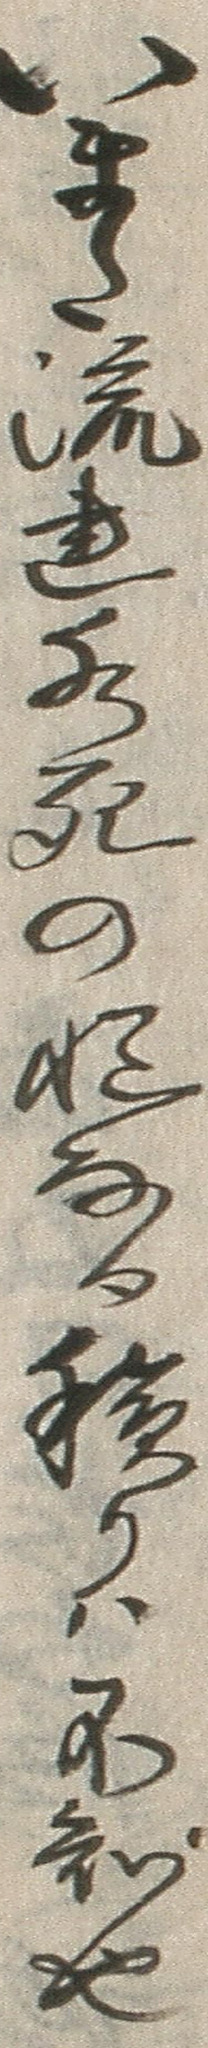いまた流れ水死の慥なる積りは不知也
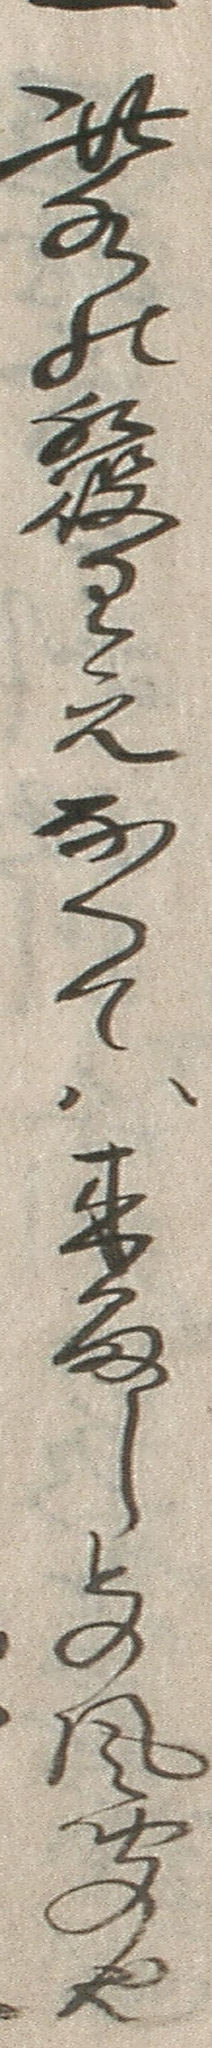一此水の発るゝ元なくては来ましとの風聞也
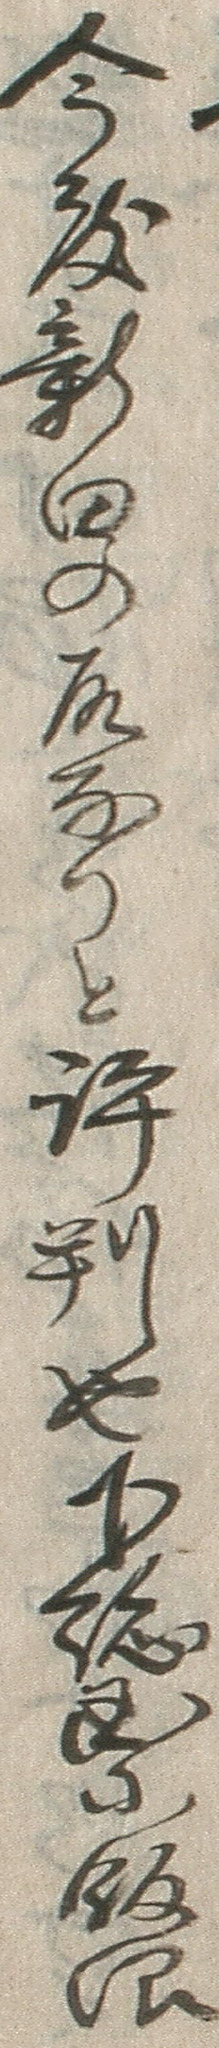今度新田の故なりと評判也下総国に飯沼
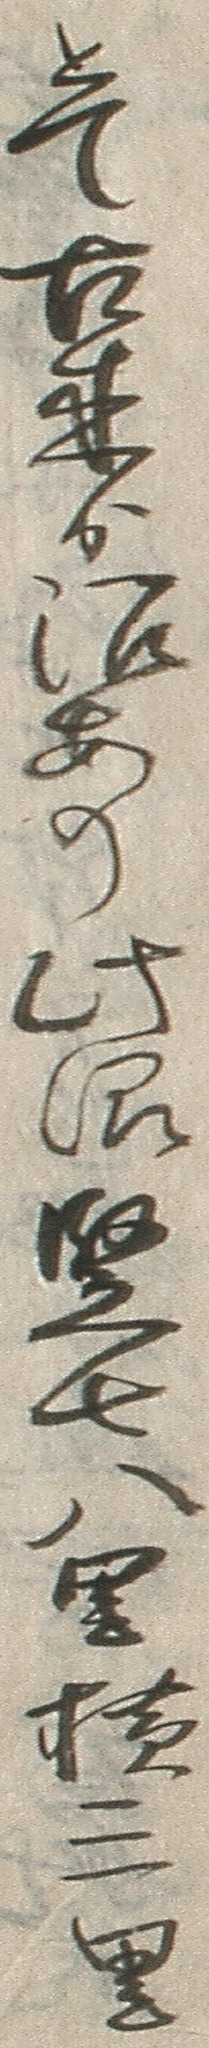とて古来ゟ沼あり此沼竪七八里横三里
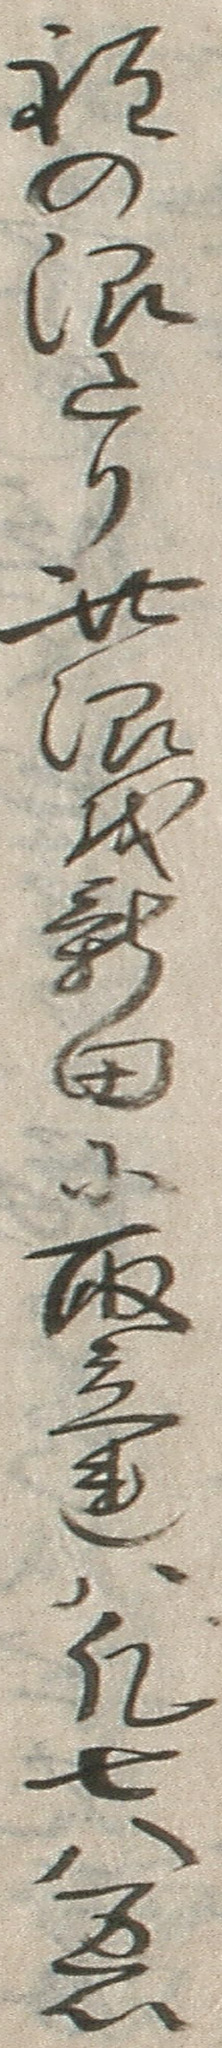程の沼たり此沼を新田に取立れは凡七八万石
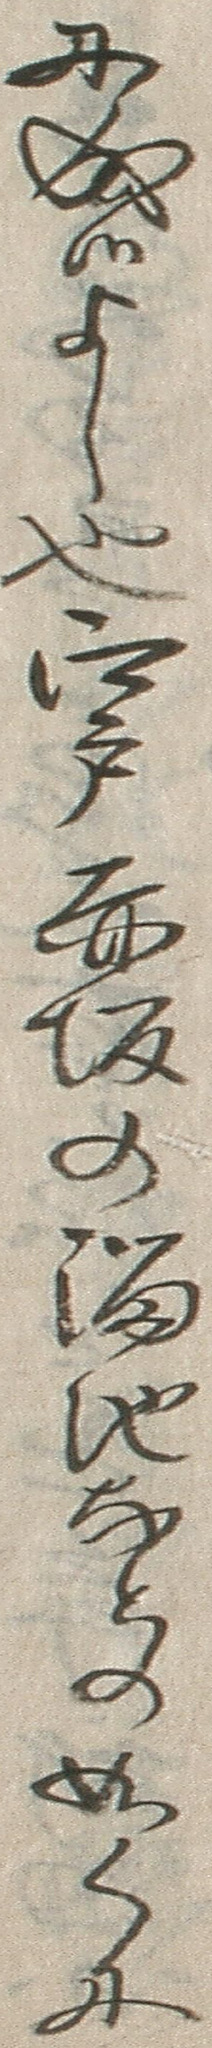に成候よし也江戸赤坂の溜池なとの如くに

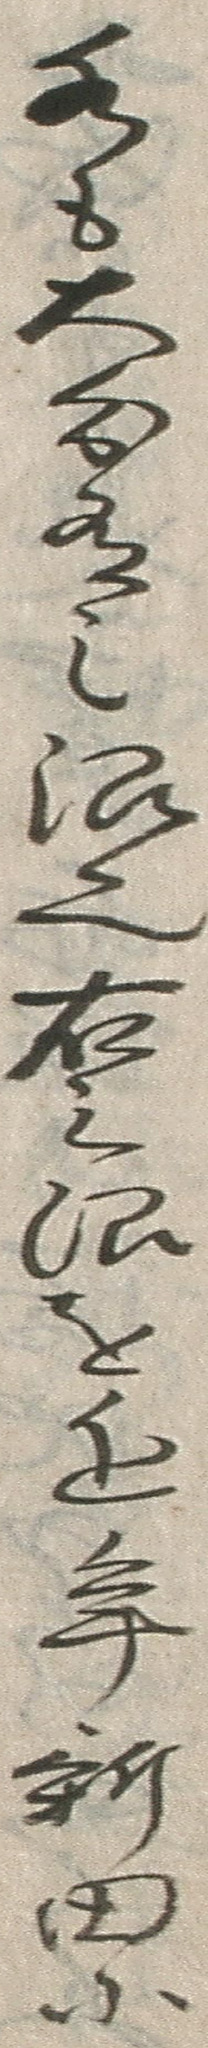水も大分有之沼也右之沼を近年新田に
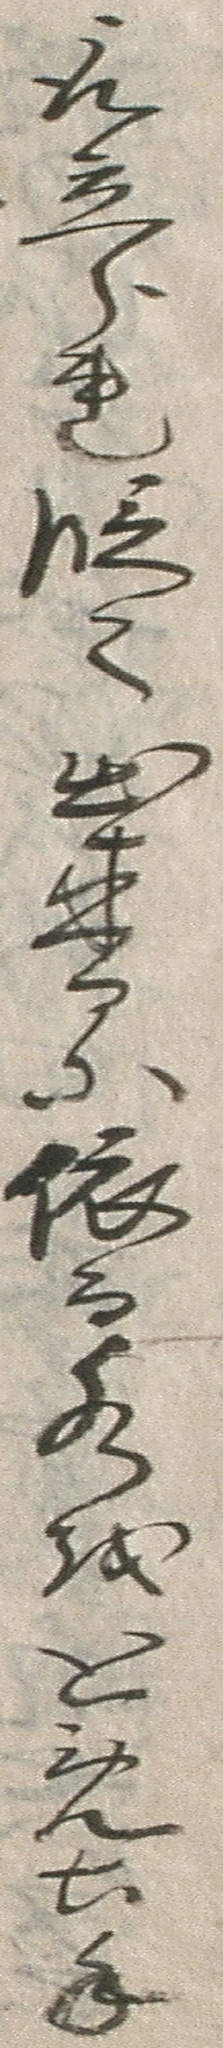取立られ段々出来るに依て水をとめ土手
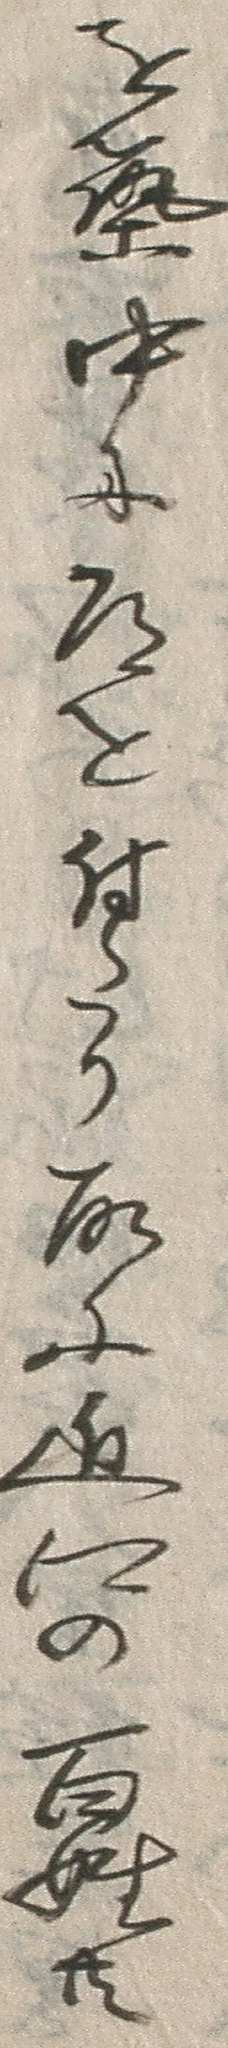を築中に道を付たり故に近郷の百姓共
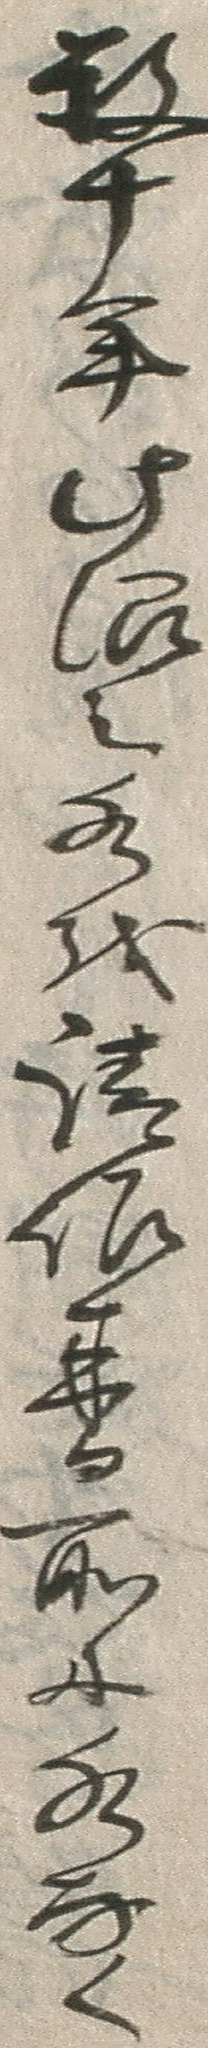数十年此沼の水を請作来る所に水なく
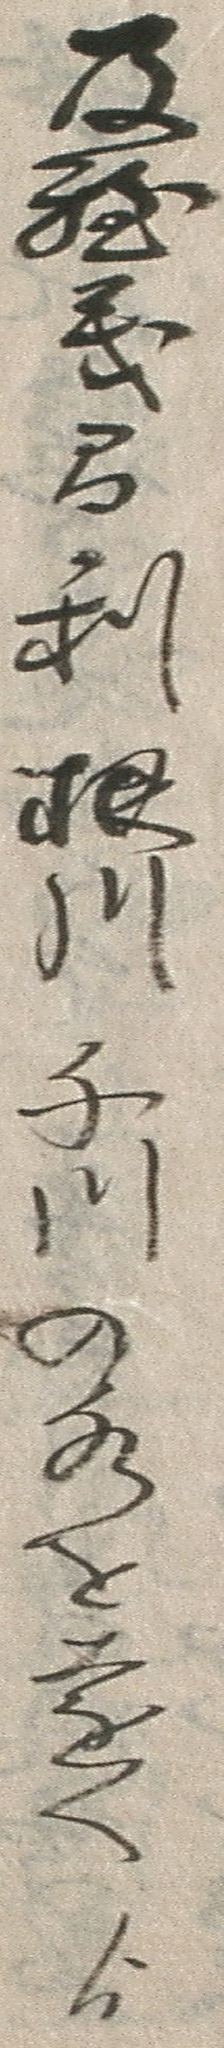及難義間利根川千川の水を遠くゟ
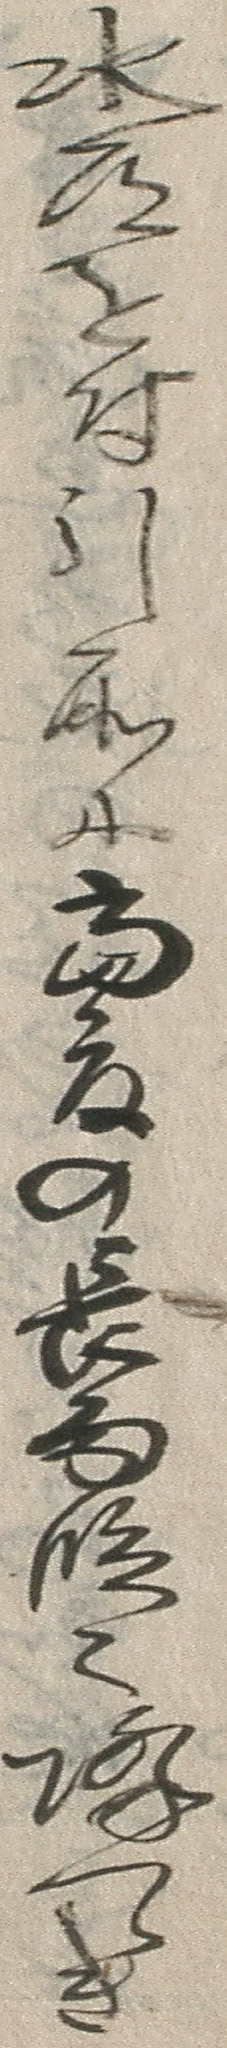水道を付引所に当度の長雨段々降つゝき
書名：享保十三年江戸洪水記
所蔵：東京大学地震研究所図書室 Earthquake Research Institute Library, The University of Tokyo, JAPAN
